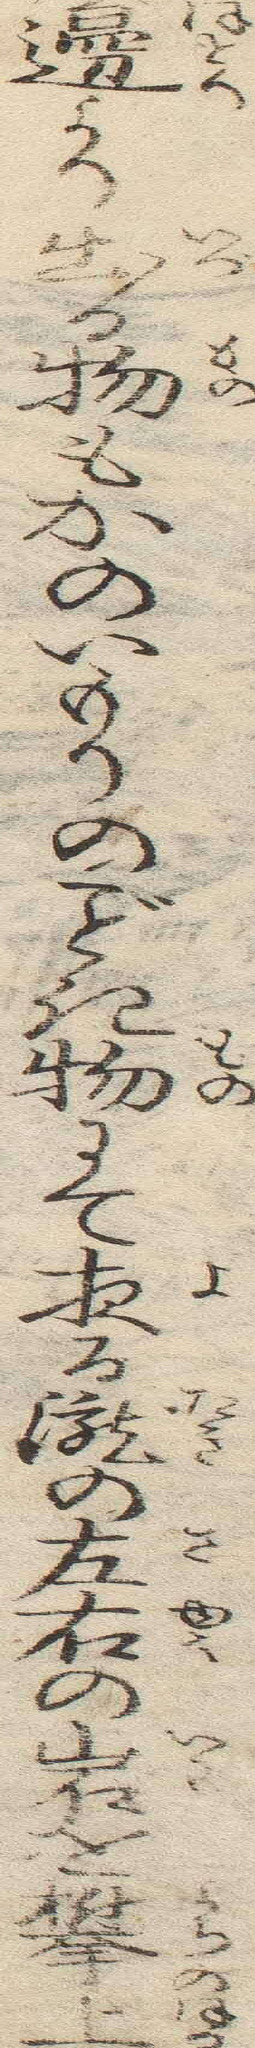辺より出る物もかのいもりのごとき物にて夜る滝の左右の岩を攀上
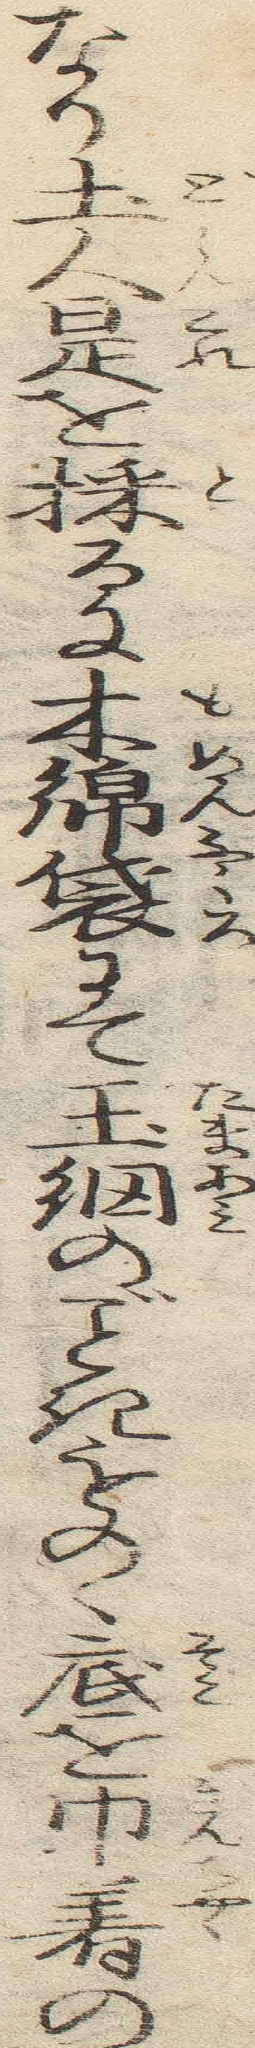なり土人是を採るに木綿袋にて玉網のごときものゝ底を巾着の
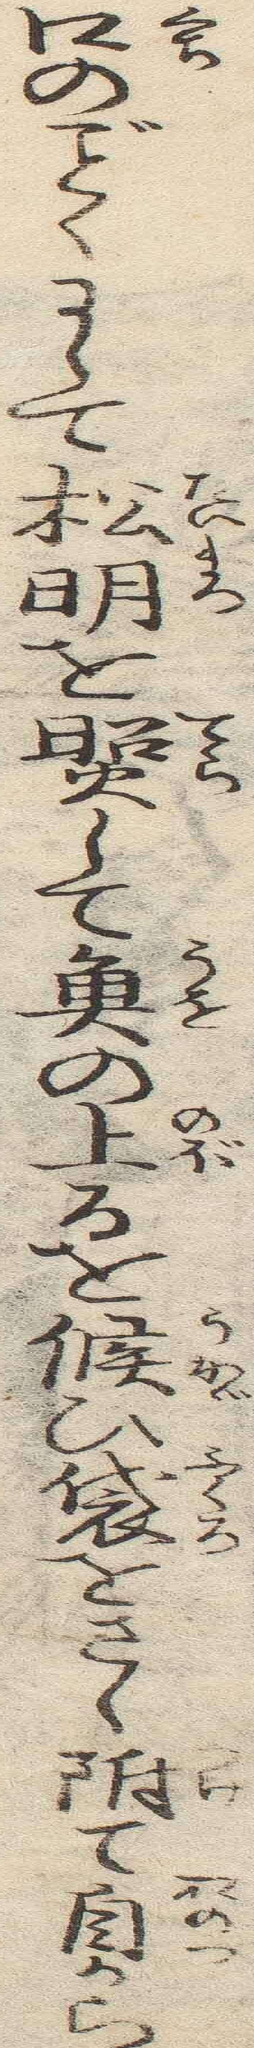口のごとくにして松明を照して魚の上るを候ひ袋をさし附て自から
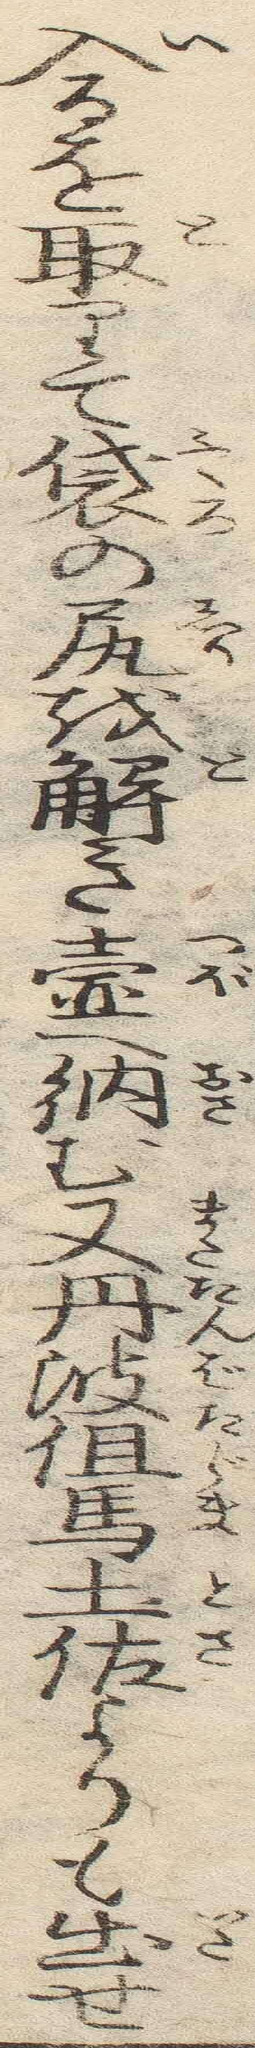入るを取りて袋の尻を解き壺へ納む又丹波但馬土佐よりも出せ
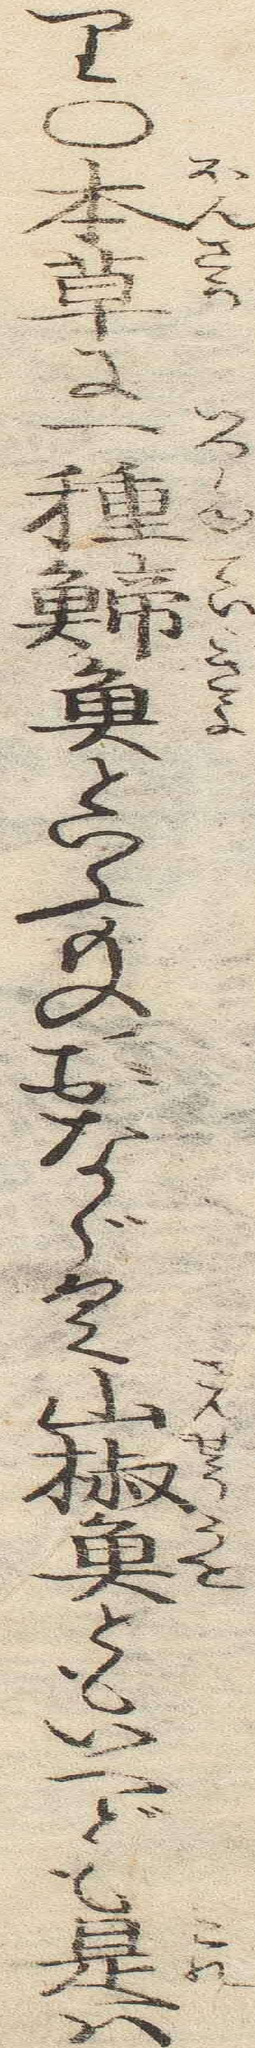り○本草に一種䱱魚といふものおなじく山椒魚ともいへども是は
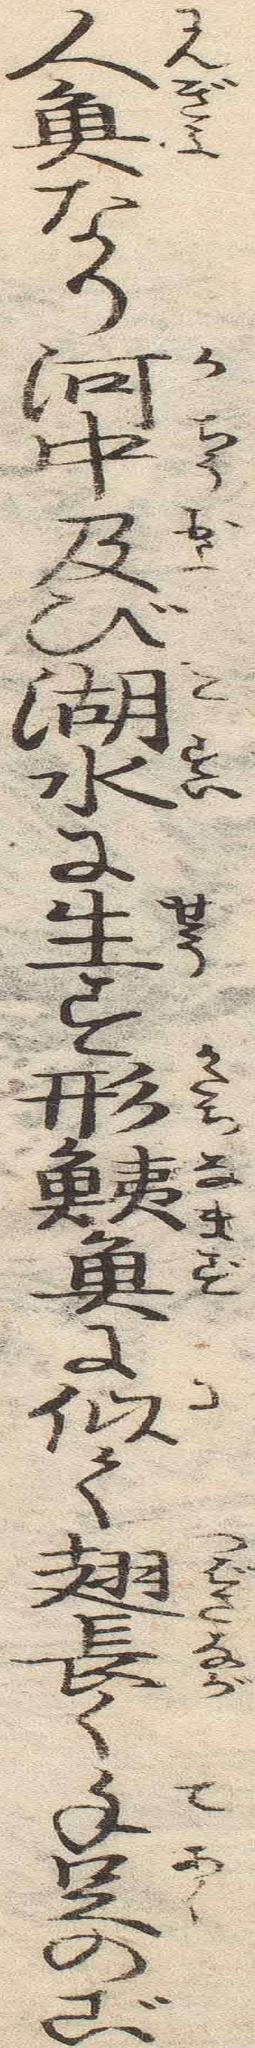人魚なり河中及び湖水に生す形鮧魚に似て翅長く手足のご
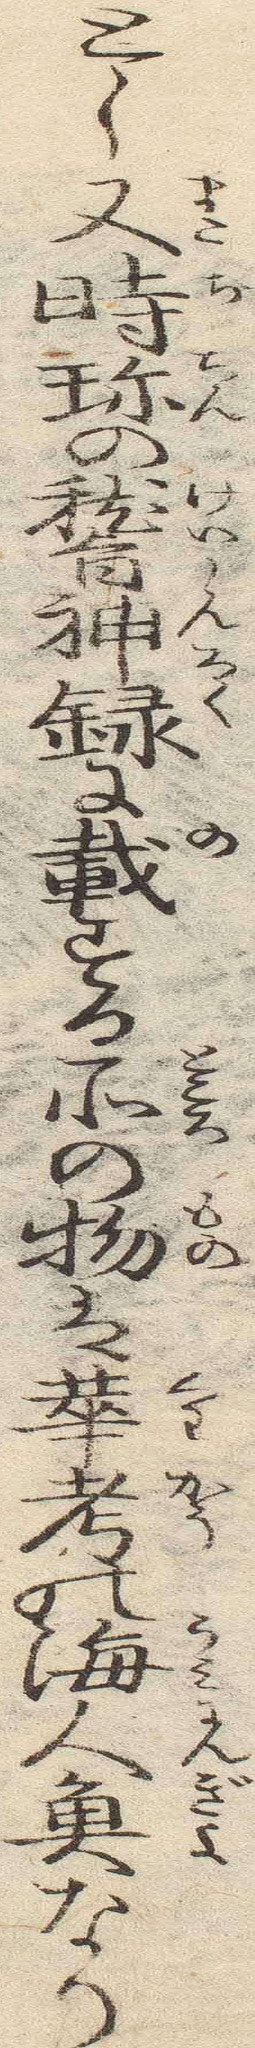とし又時珎の稽神録に載する所の物は華考の海人魚なり
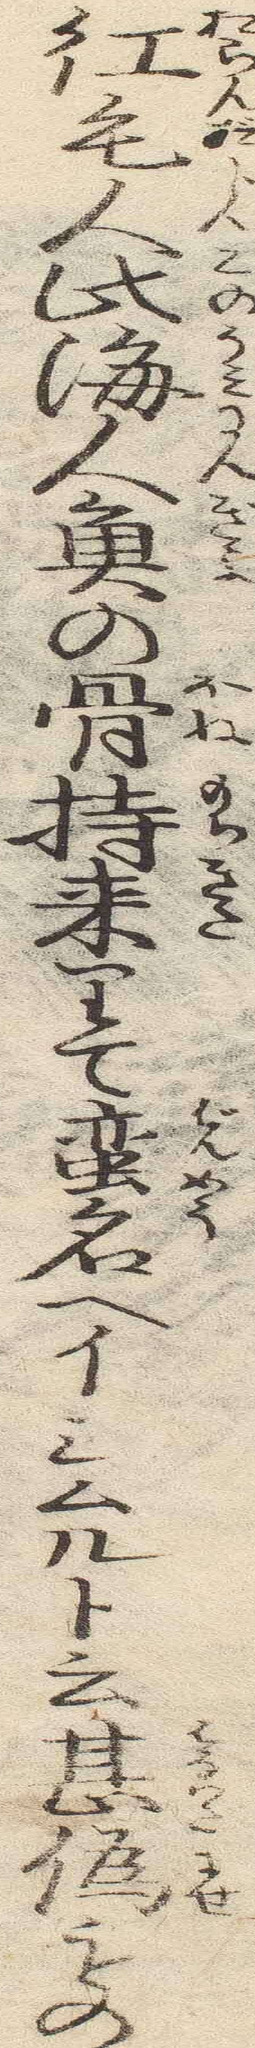紅毛人此海人魚の骨持来りて蛮名ヘイシムルト云甚偽もの
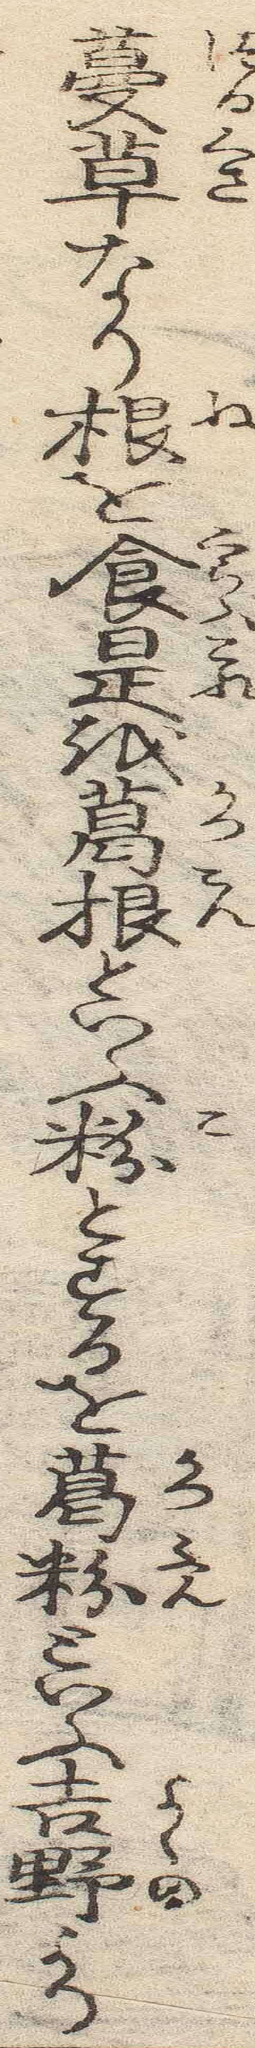蔓草なり根を食是を葛根といふ粉とするを葛粉といふ吉野より
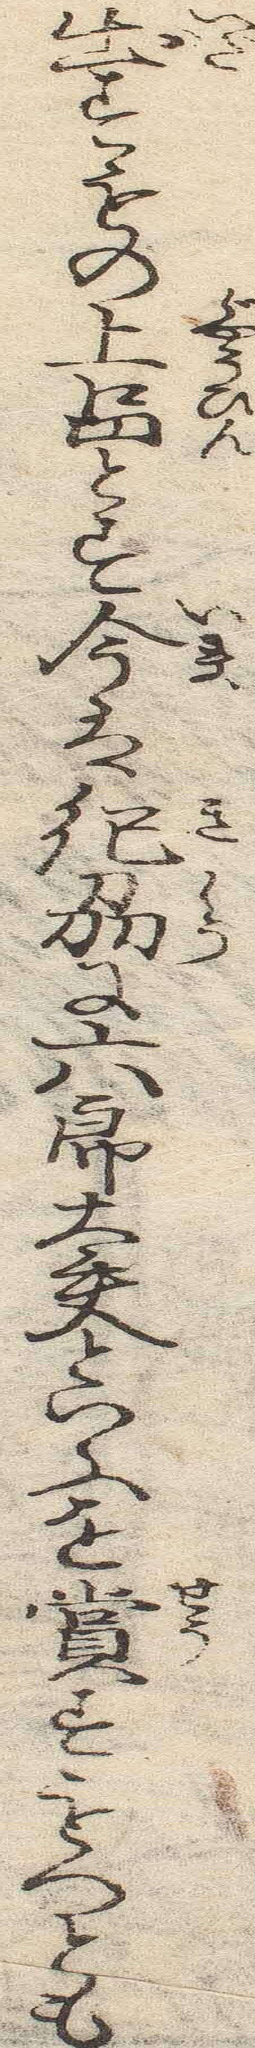出すもの上品とす今は紀州に六郎大夫といふを賞すもつとも
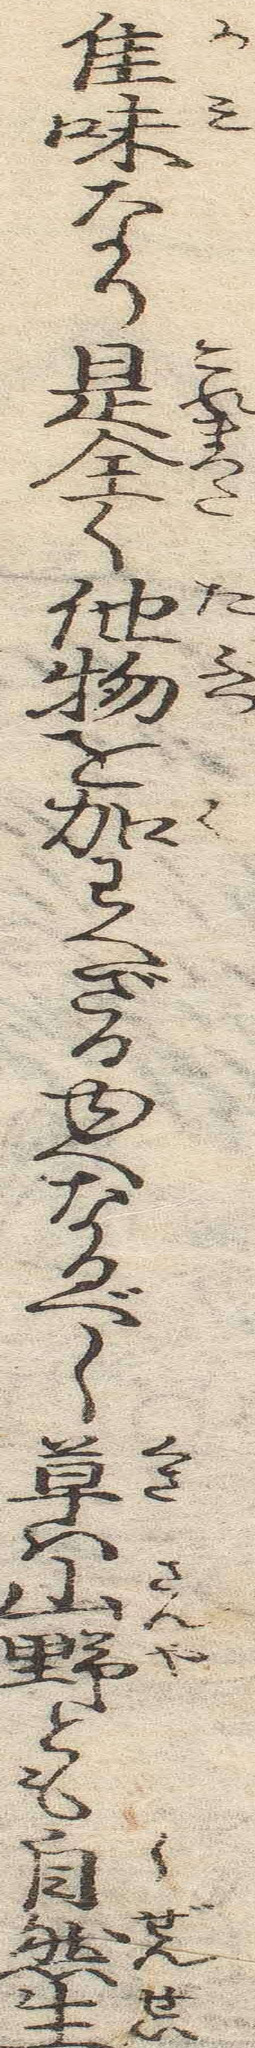佳味なり是全く他物を加わへざるゆへなるべし草は山野とも自然生
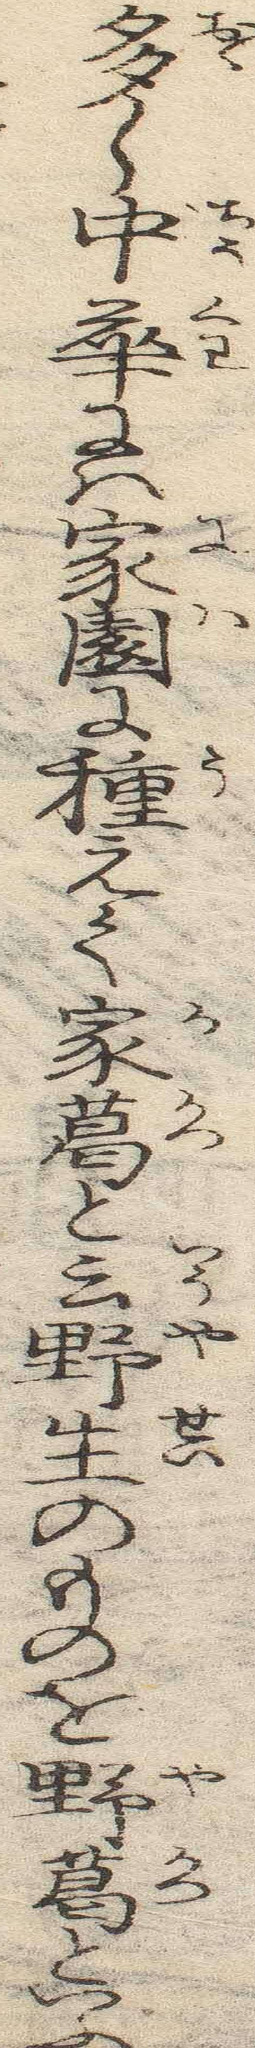多し中華には家園に種えて家葛と云野生のものを野葛といふ
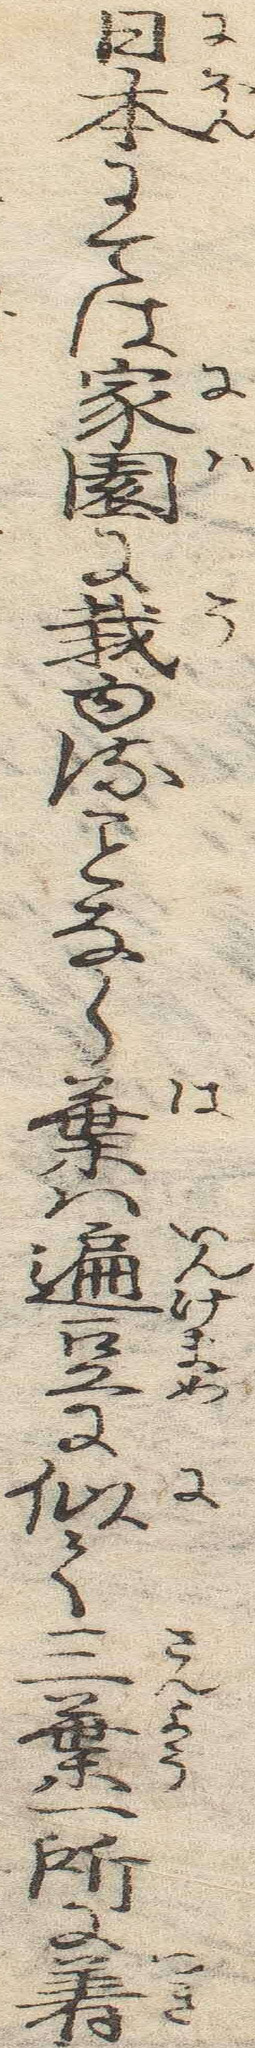日本にては家園に栽ゆることなし葉は遍豆に似て三葉一所に着
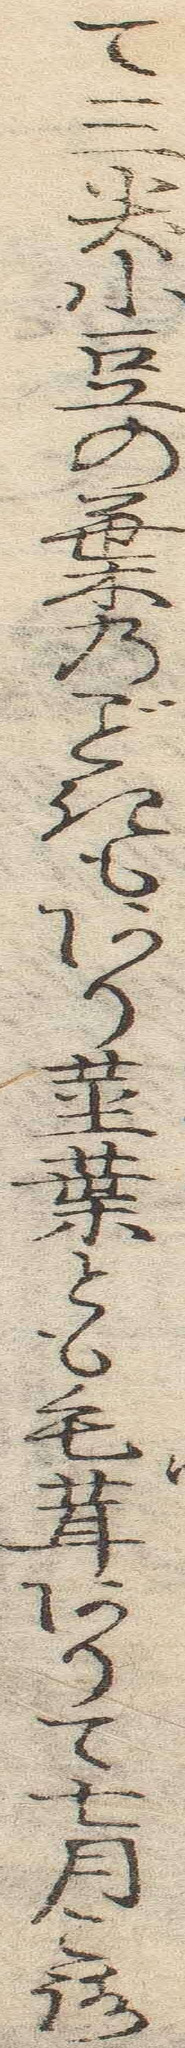て三尖小豆の葉のごときもあり茎葉とも毛茸ありて七月ころ
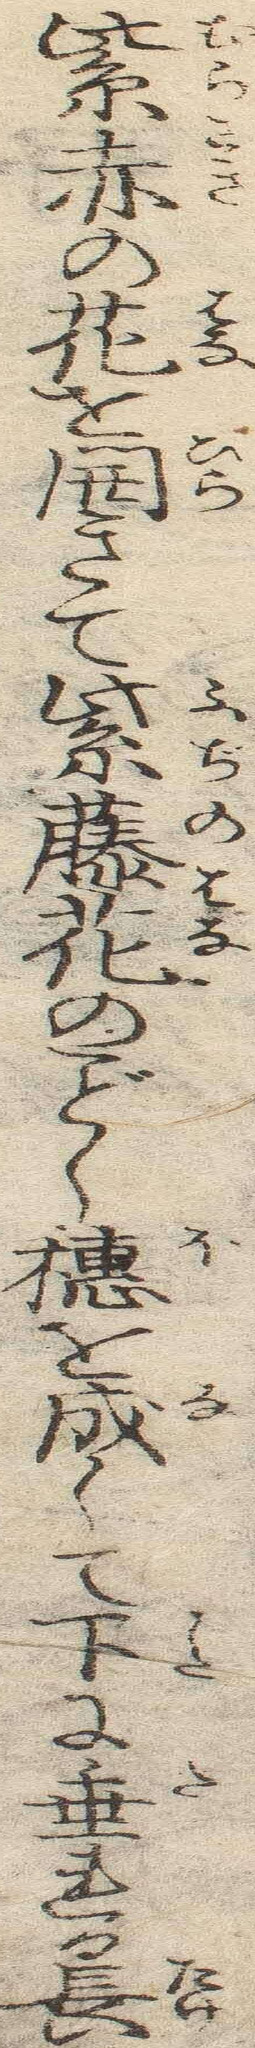紫赤の花を開きて紫藤花のごとし穂を成して下に垂れる長
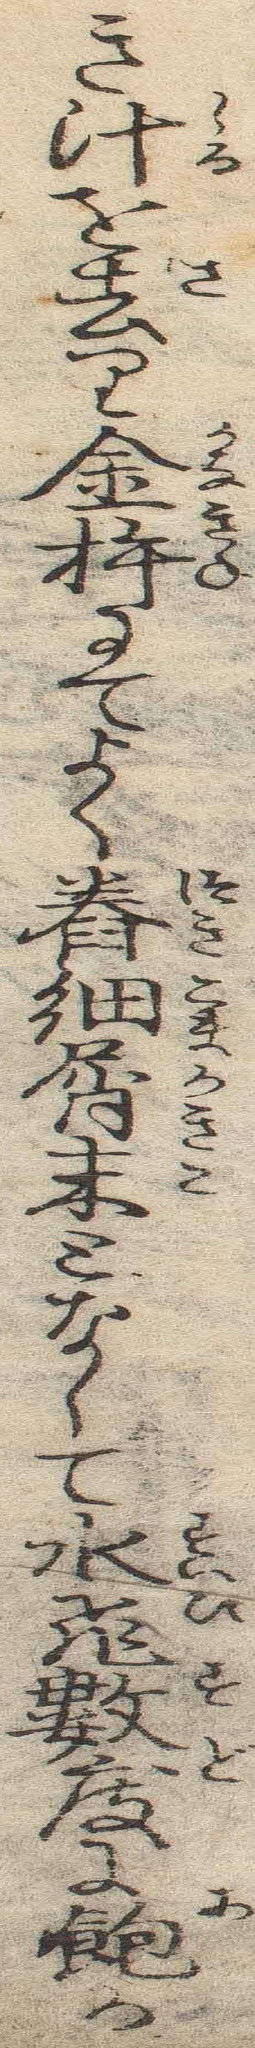き汁を去り金杵にてよく舂細屑末となして水飛数度に飽か
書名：日本山海名産図会
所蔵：東京学芸大学附属図書館 国文学研究資料館
